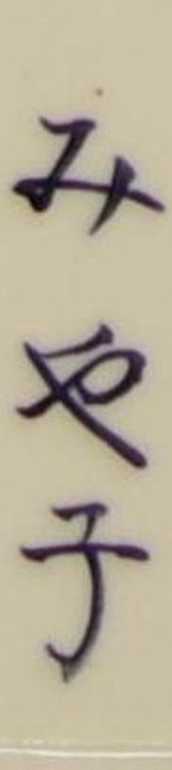みや子
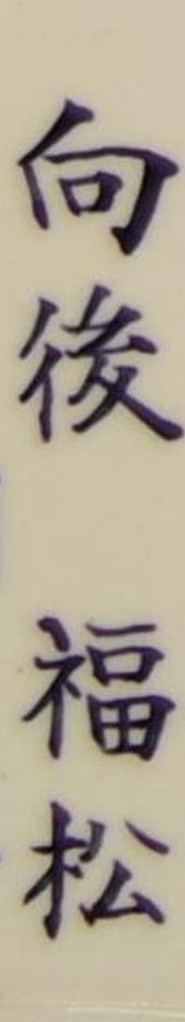向後福松
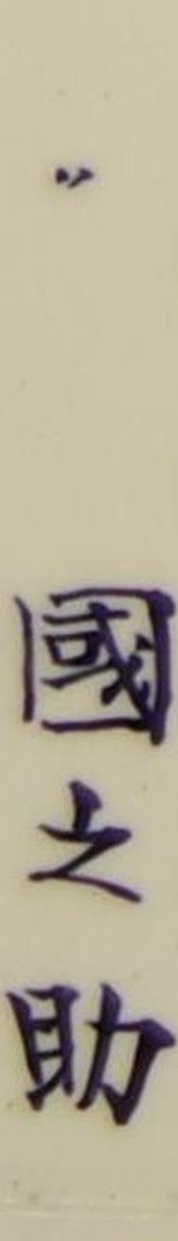勘之助
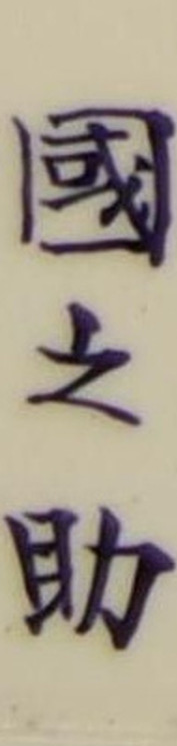勘之助
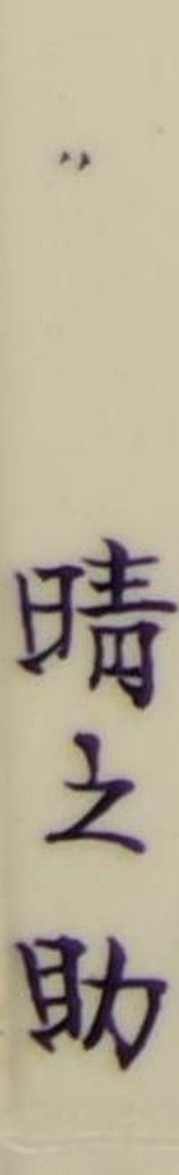晴之助
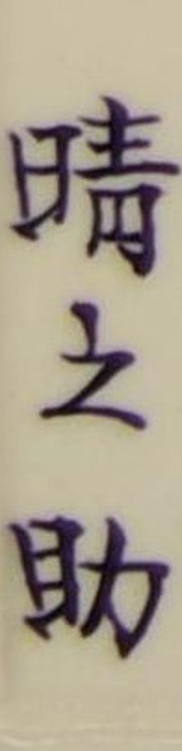晴之助

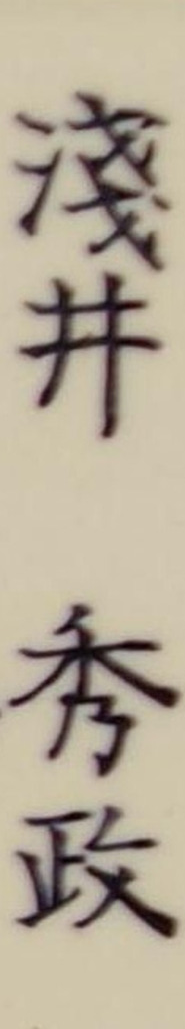浅井秀政
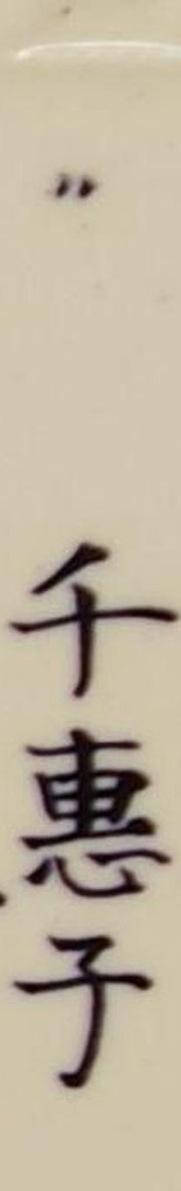千恵子
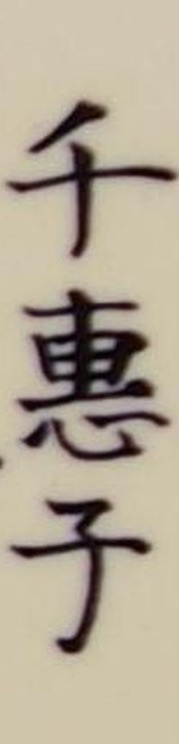千恵子
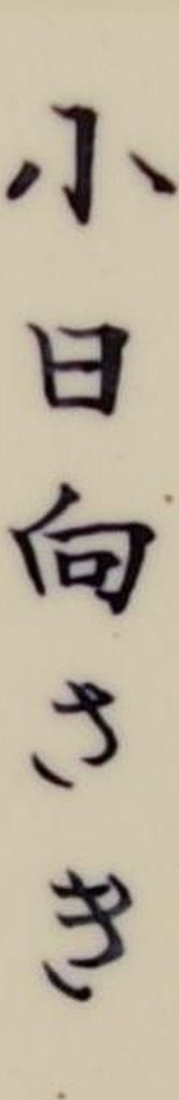小日向さき
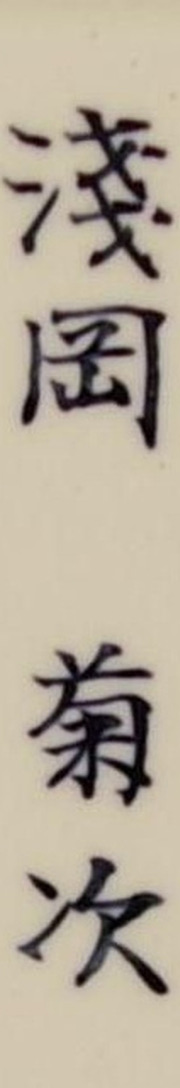浅岡菊次
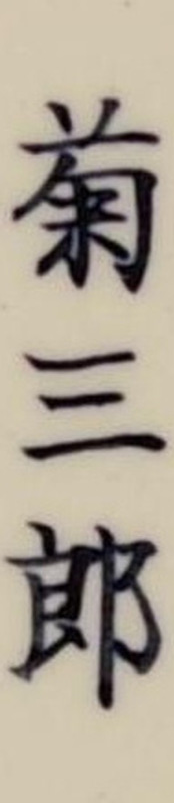菊三郎
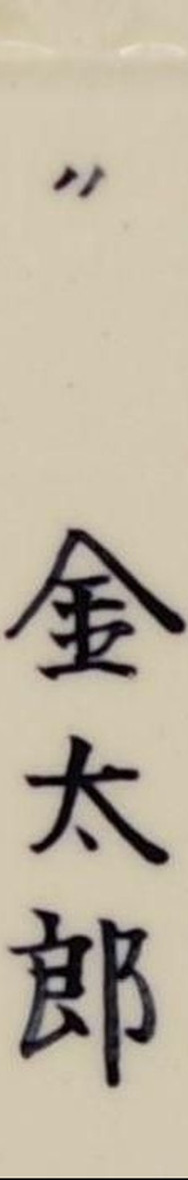金太郎
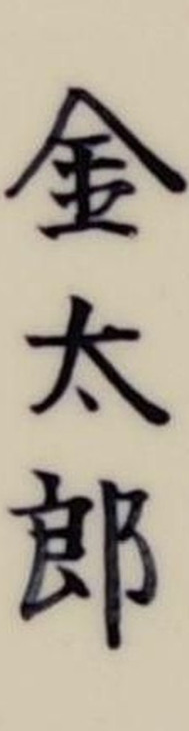金太郎
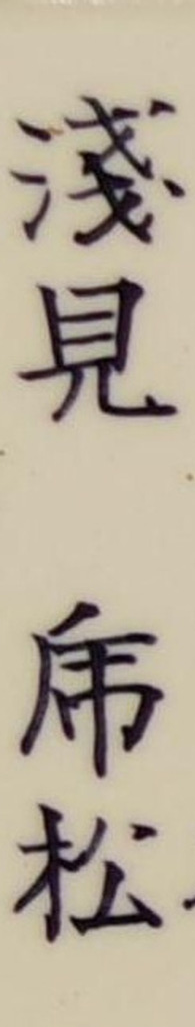浅見乕松
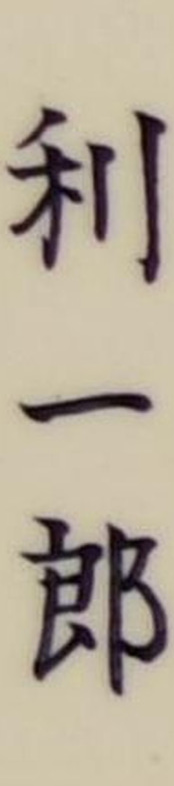利一郎
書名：E~L
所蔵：高野山金剛峯寺
